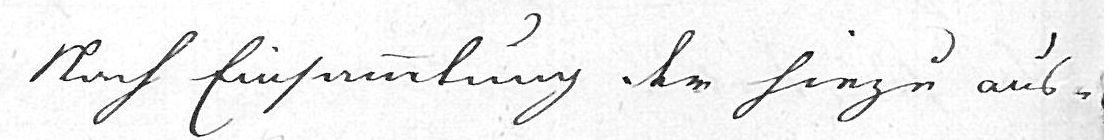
Nach Einsammlung der hierzu aus-
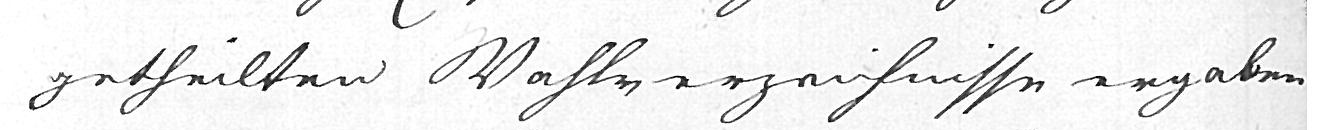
getheilten Wahlverzeichnisse ergaben
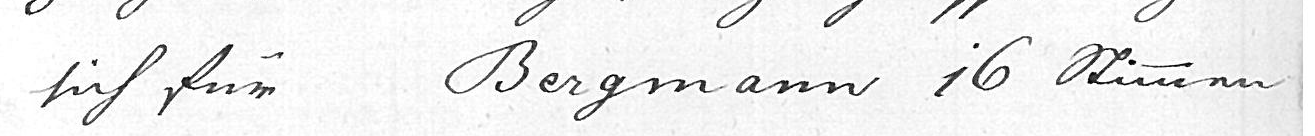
sich für Bergmann 16 Stimmen
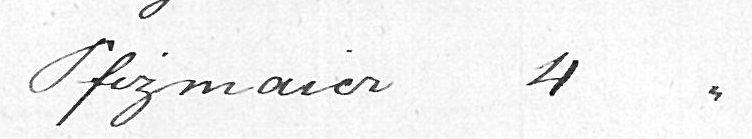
Pfizmaier 4 "
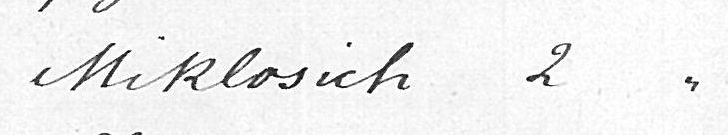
Miklosich 2 "
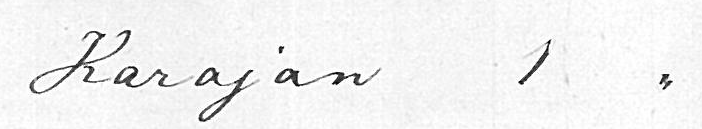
Karajan 1 "
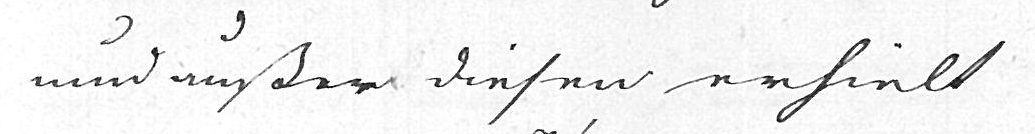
und außer diesen erhielt
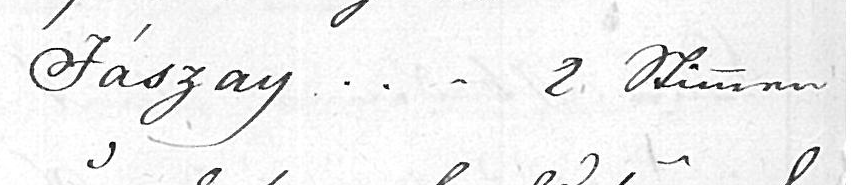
Jaszay . . . 2 Stimmen
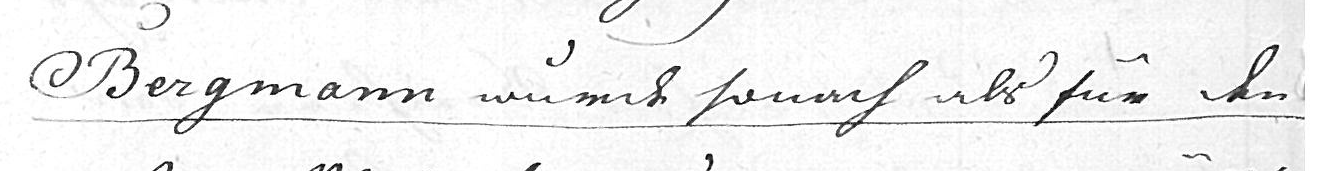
Bergmann wurde sonach als für den
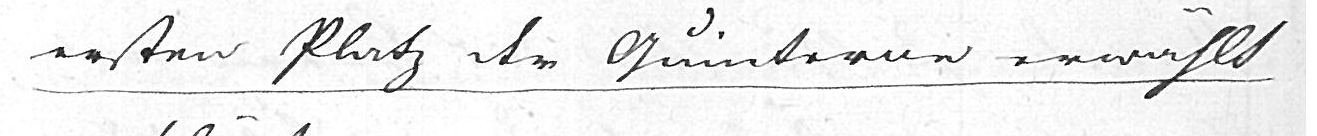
ersten Platz der Quinterne erwählt
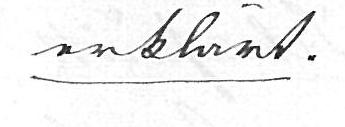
erklärt.
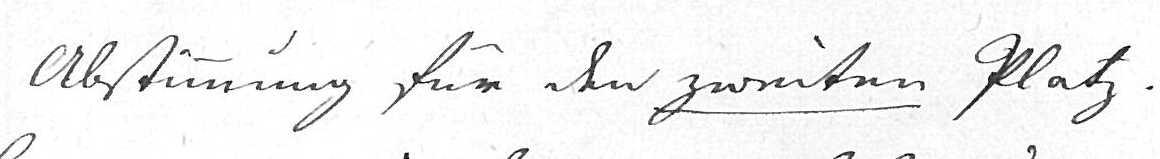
Abstimmung für den zweiten Platz.
